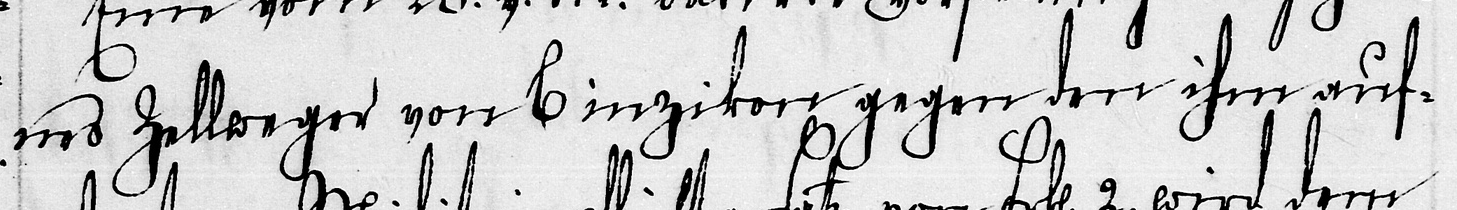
nes Zellweger von Binzikon gegen den ihm auf¬
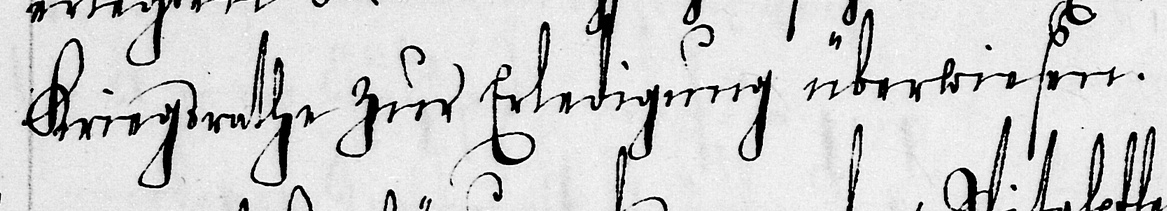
Kriegsrathe zur Erledigung überwiesen.
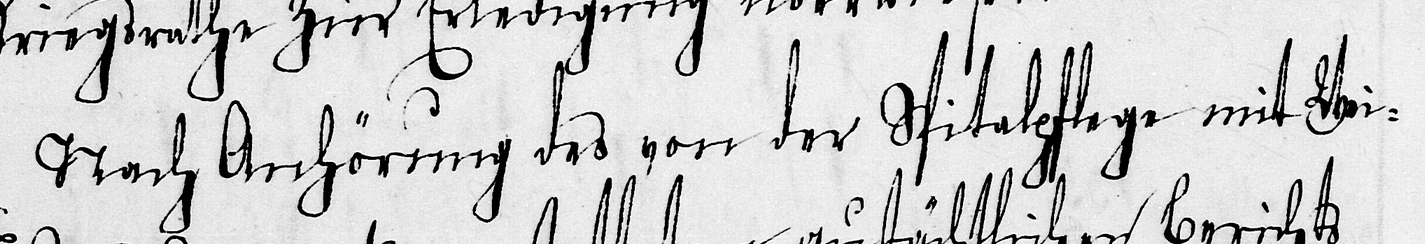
Nach Anhörung des von der Spitalpflege mit Wei¬
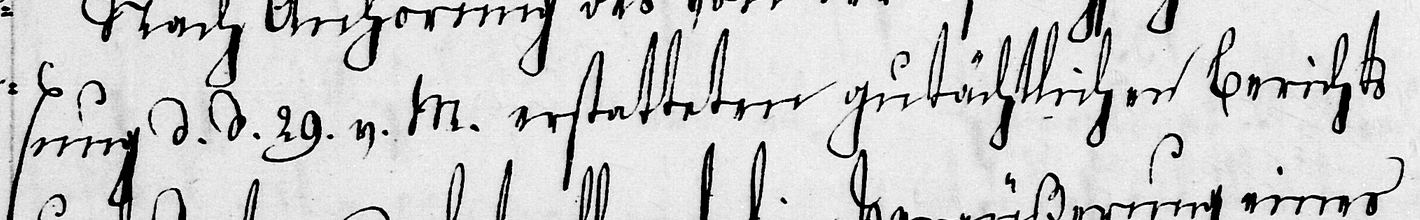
sung d. d. 29. v. M. erstatteten gutächtlichen Berichts
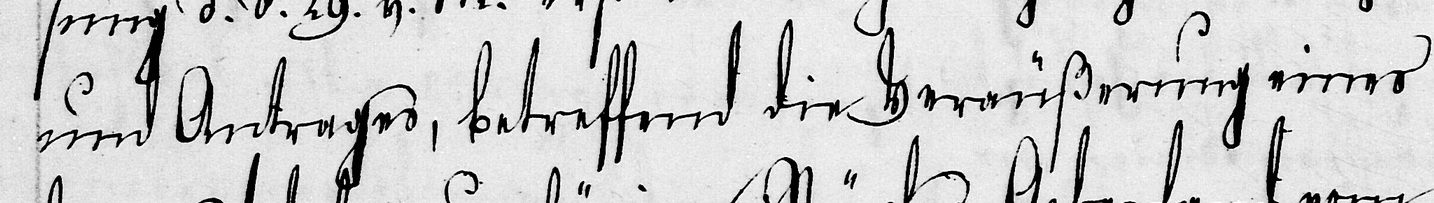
und Antrages, betreffend die Veräußerung eines
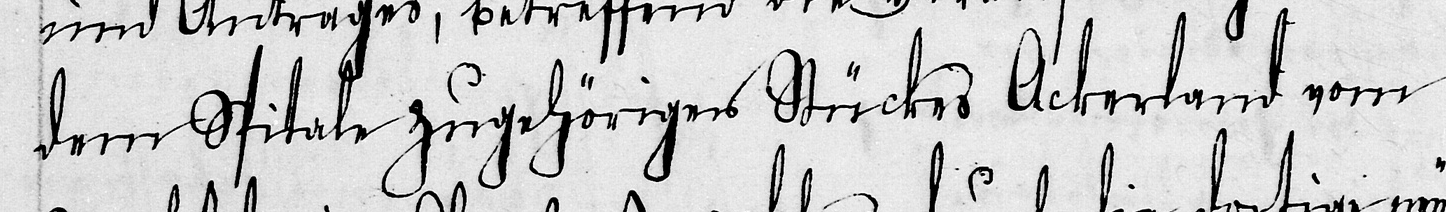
dem Spitale zugehörigen Stückes Ackerland vom
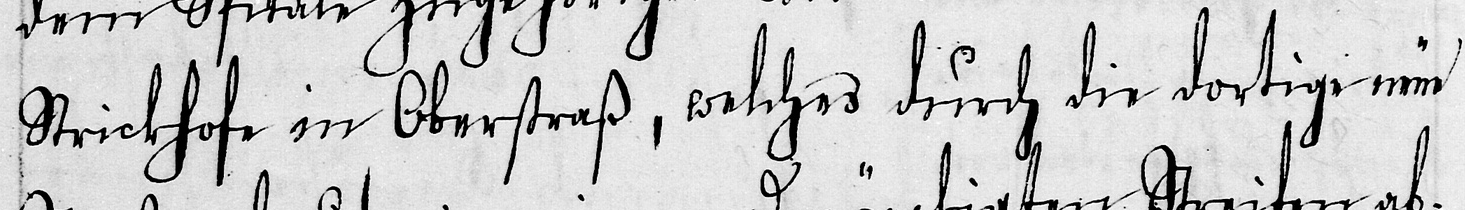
Strickhofe in Oberstraß, welches durch die dortige neu¬
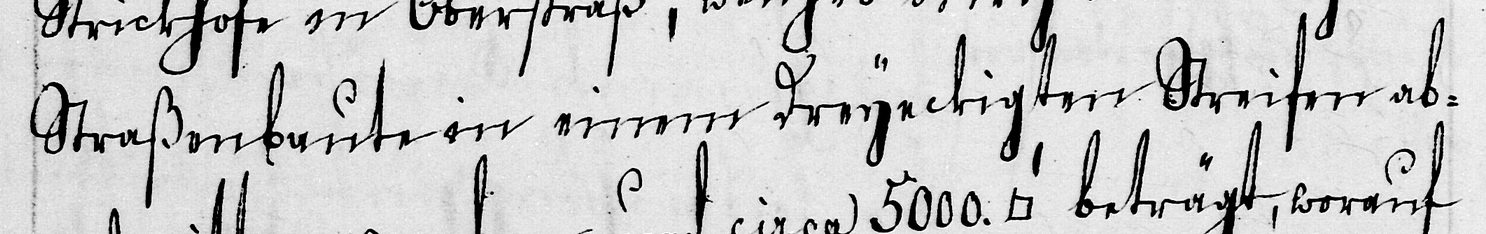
Straßenbaute in einem Dreyeckigten Streifen ab¬
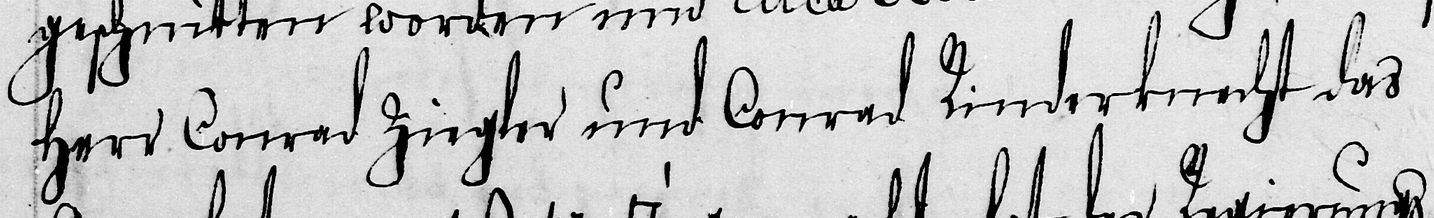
Herr Conrad Ziegler und Conrad Rinderknecht das
